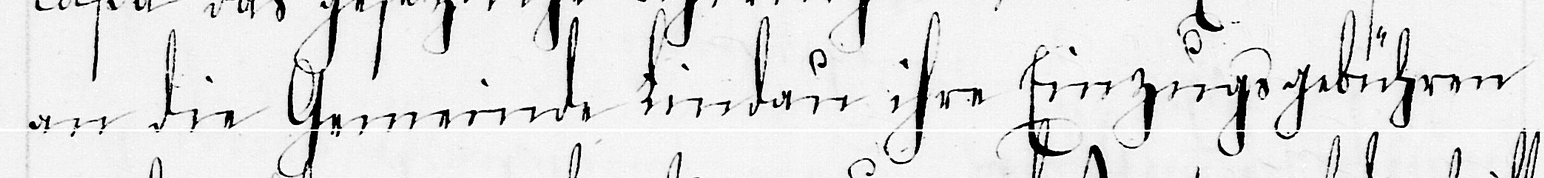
an die Gemeinde Lindau ihre Einzugsgebühren
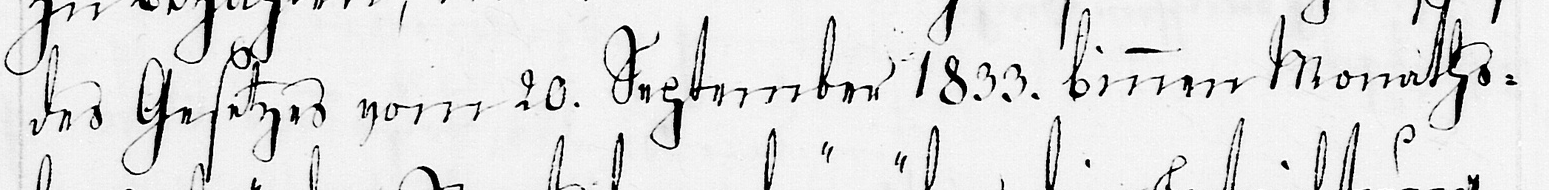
des Gesetzes vom 20. September 1833. binnen Monaths¬
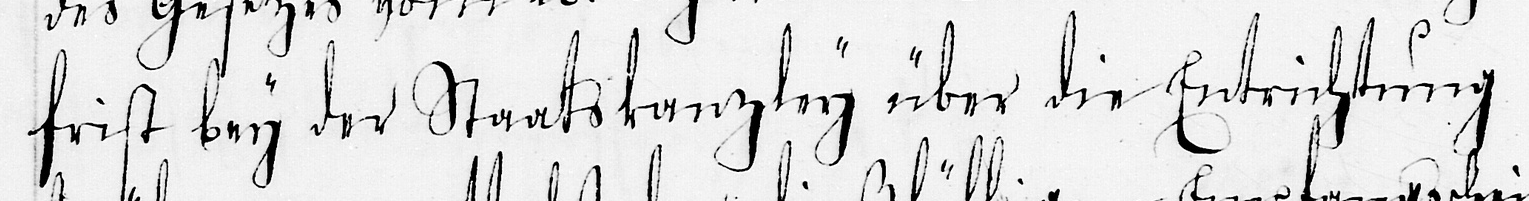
frist bey der Staatskanzley über die Entrichtung
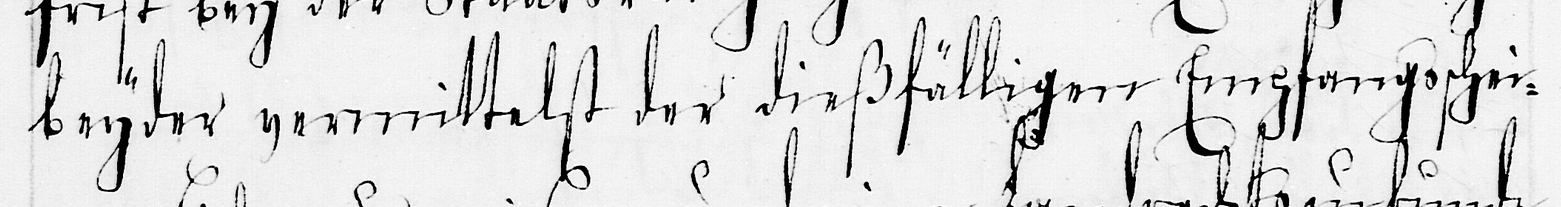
beyder vermittelst der dießfälligen Empfangssche¬
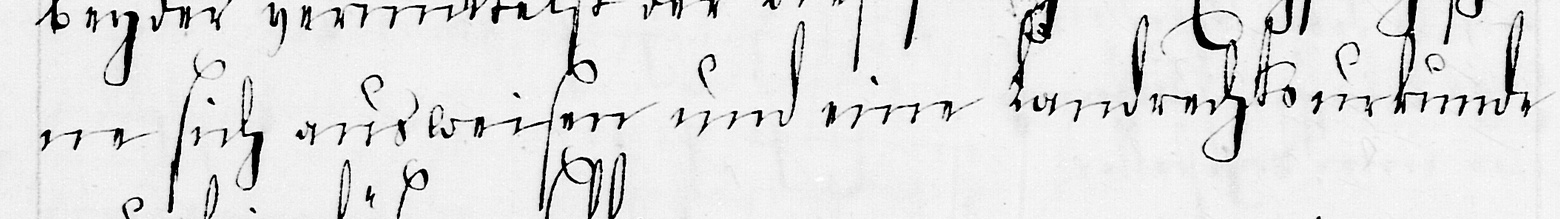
ine sich ausweisen und eine Landrechtsurkunde
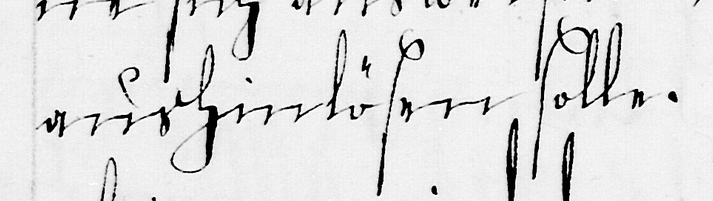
aushinlösen solle.
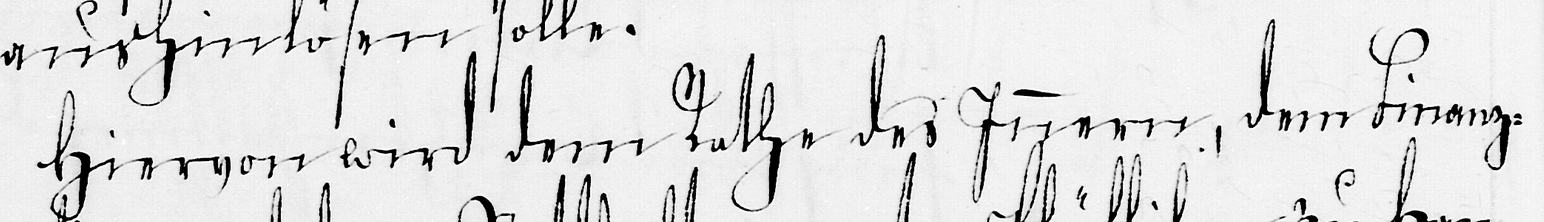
Hiervon wird dem Rathe des Innern, dem Finan¬
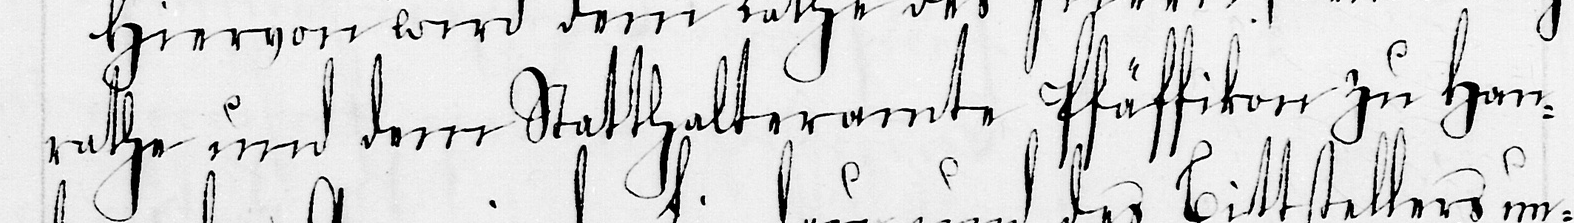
zrathe und dem Statthalteramte Pfäffikon zu Han¬
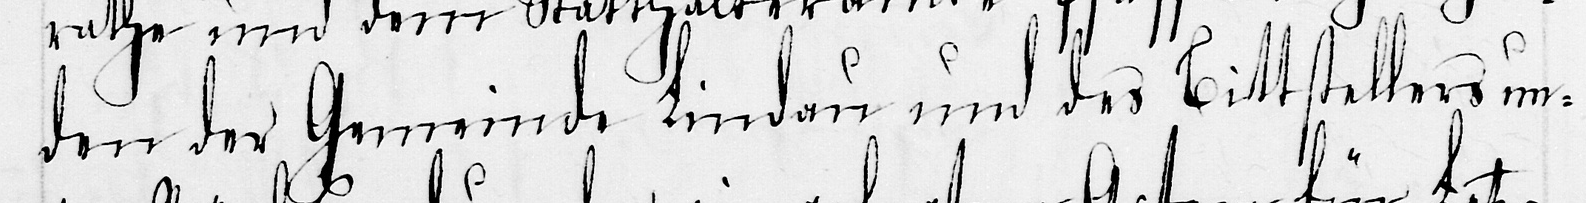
den der Gemeinde Lindau und des Bittstellers u¬
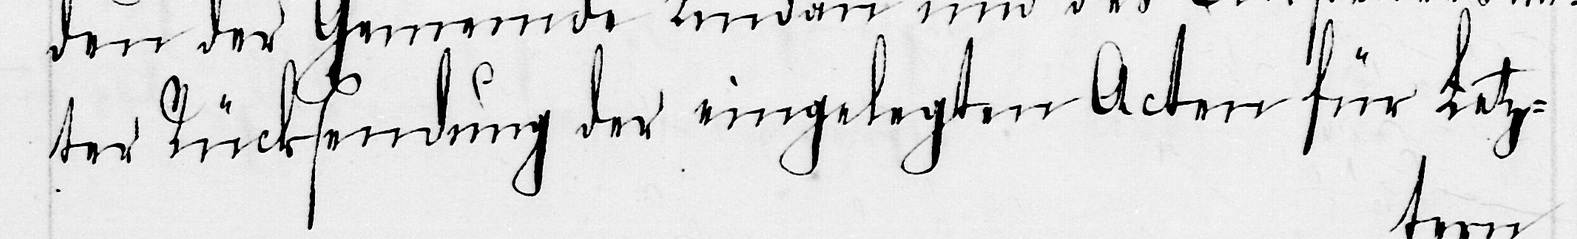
nter Rücksendung der eingelegten Acten für Letz-
